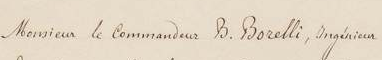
Monsieur le Commandeur B. Borelli, Ingénieur
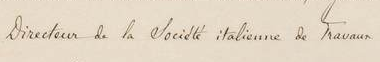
Directeur de la Société italienne de Travaux
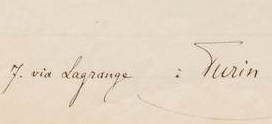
7. via Lagrange: Turin
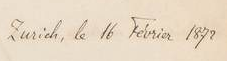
Zurich, le 16 Février 1872
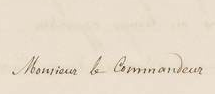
Monsieur le Commandeur
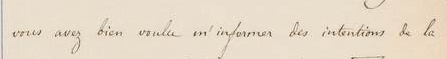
vous avez bien voulu m'informer des intentions de la
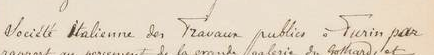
Société italienne des Travaux publics à Turin par
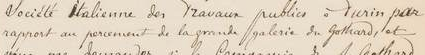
rapport au percement de la grande galerie du Gothard, et
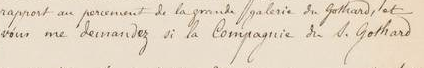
vous me demandez si la Compagnie du S. Gothard
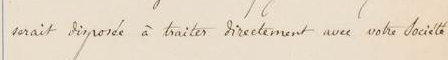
serait disposée a traiter directement avec votre Société
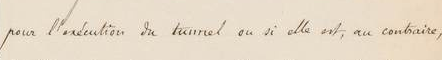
pour l'exécution du tunnel ou si elle est, au contraire,
